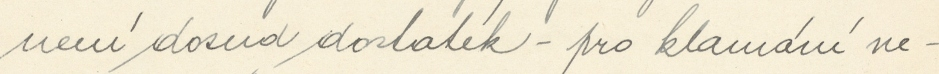není dosud dostatek - pro klamání ne-
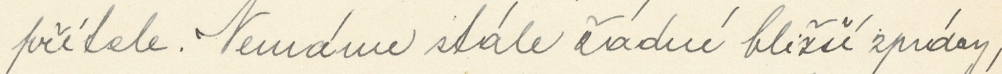přítele. Nemáme stále žádné bližší zprávy,
